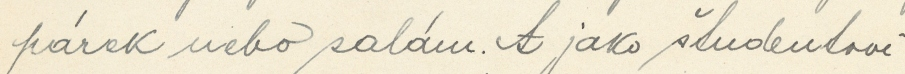párek nebo salám. A jako studentovi
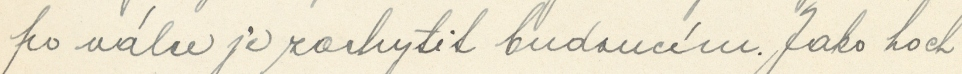po válce je zachytit budoucím. Jako hoch
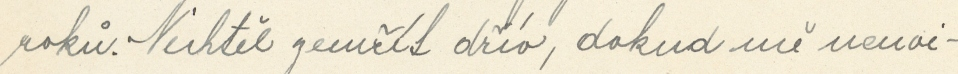roků. Nechtěl zemřít dřív, dokud mě neuvi-
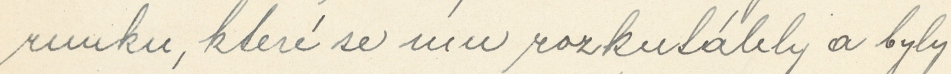runku, které se mu rozkutálely a byly
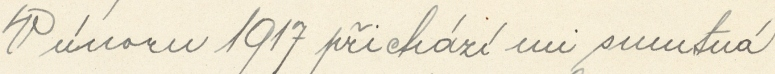V únoru 1917 přichází mi smutná
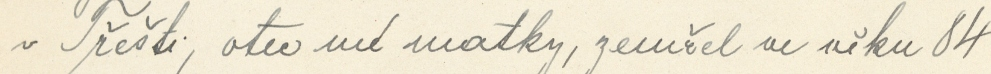v Třešti, otec mé matky, zemřel ve věku 84
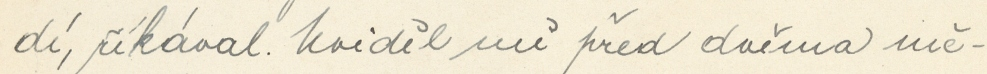dí, říkával. Uviděl mě před dvěma mě-
